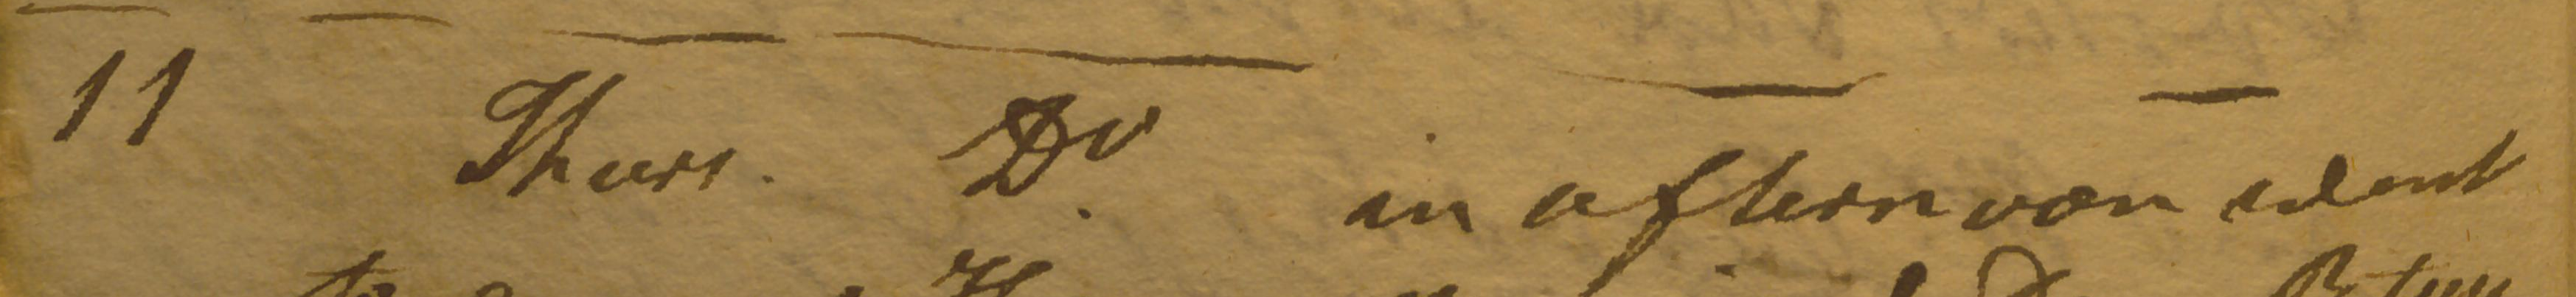11 Thurs. D^o. in afternoon went
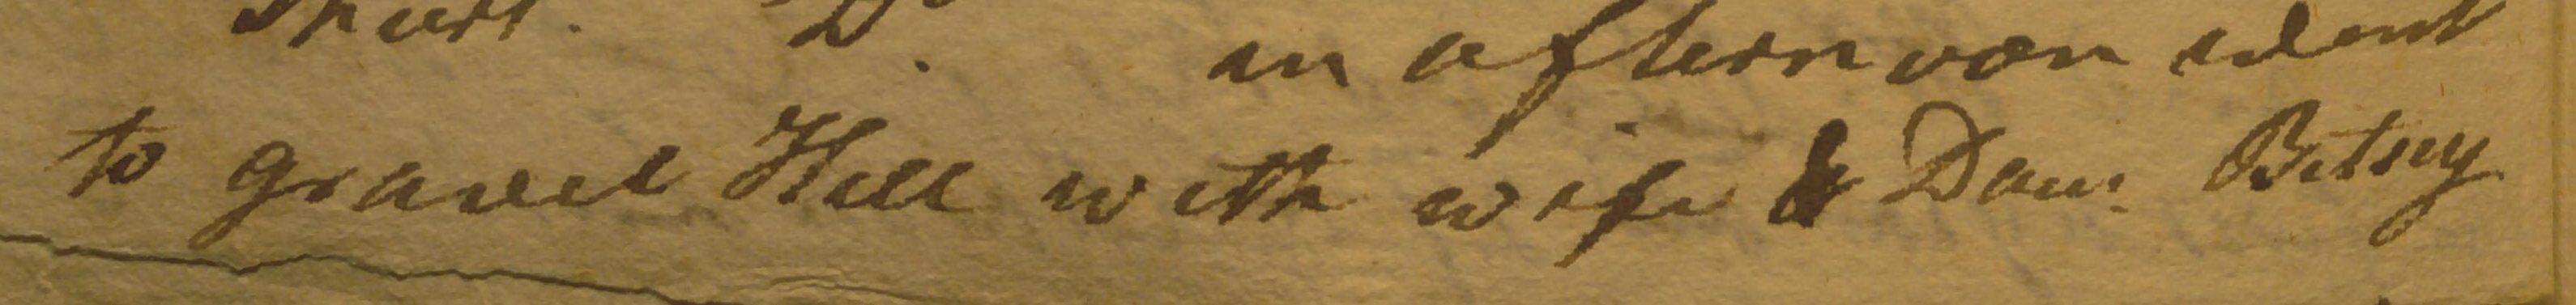to gravel Hill with wife & Daur Betsey
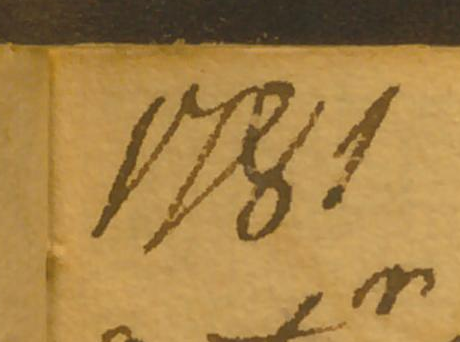1781
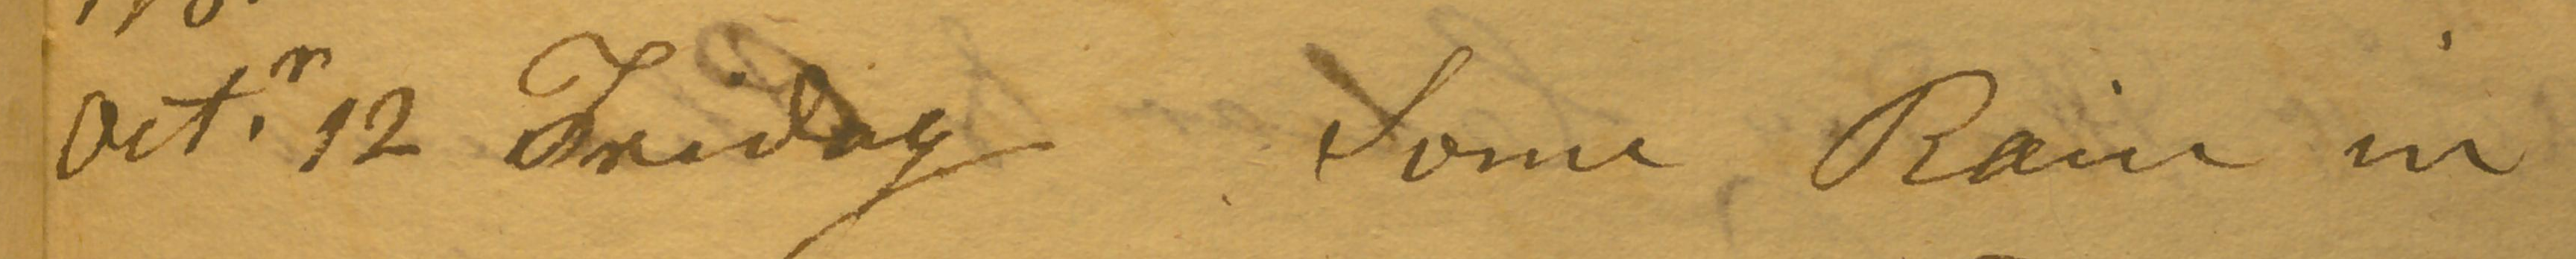Oct^r. 12 Friday some Rain in
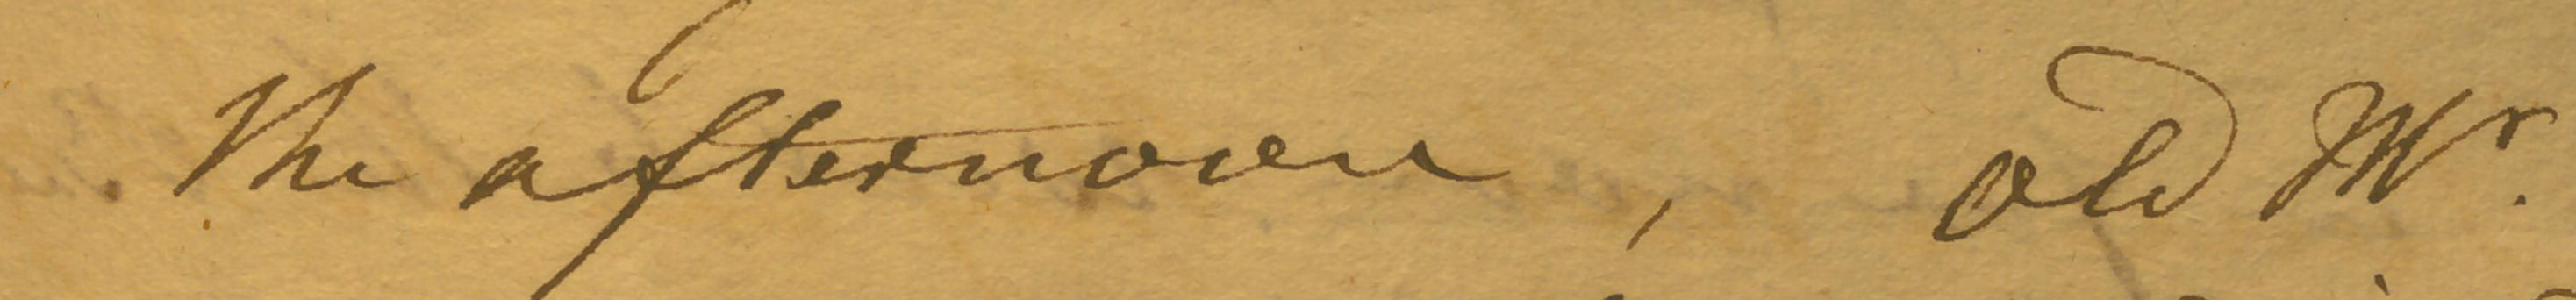the afternoon, old M^r.
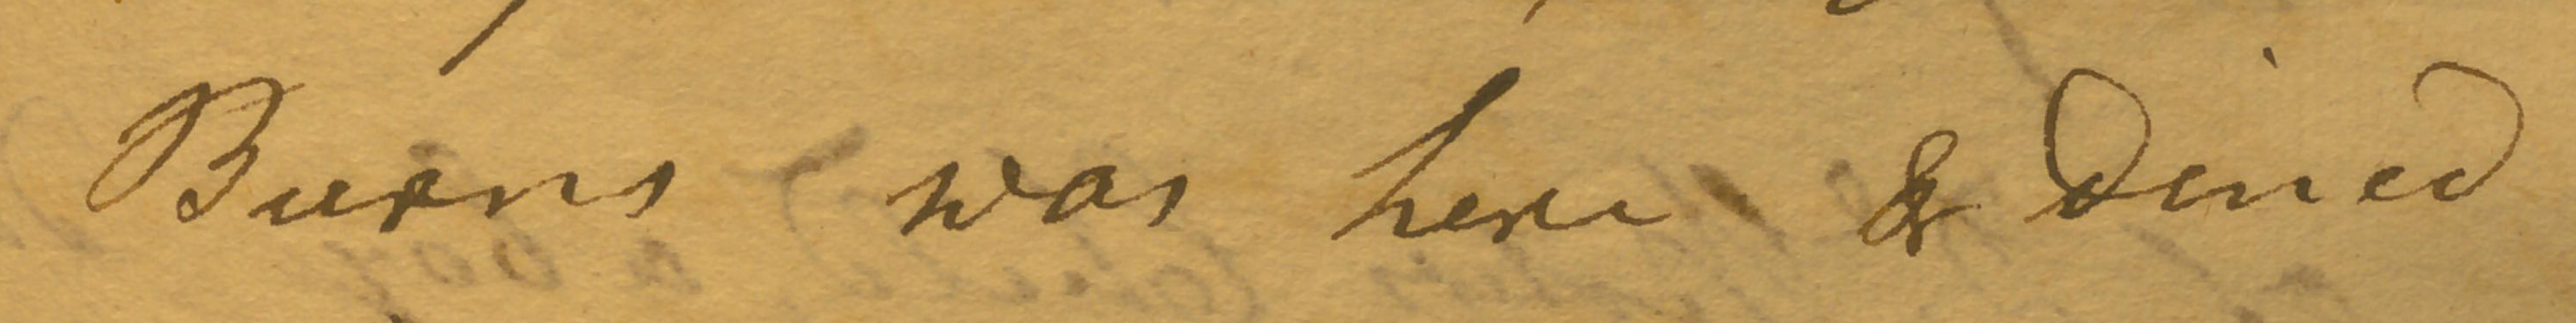Burns was here & dined
